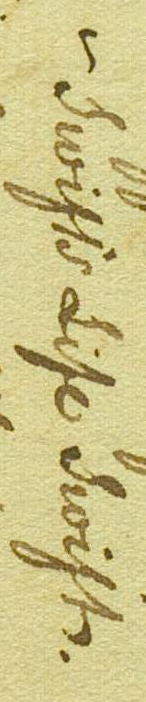- Swift's Life Swift.
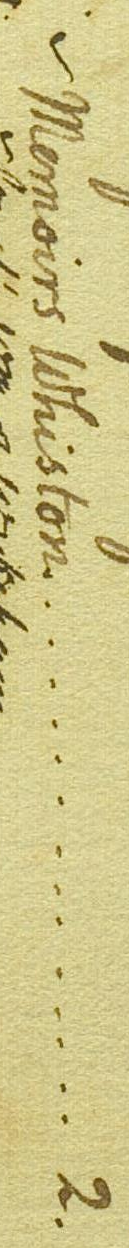- Memoirs Whiston ..............2.
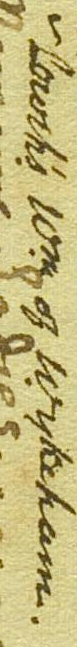- Lowth's W^m of Wykeham.
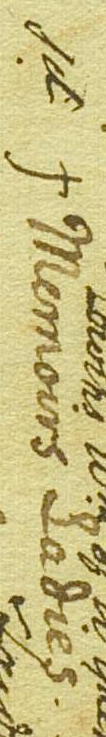Memoirs Ladies.
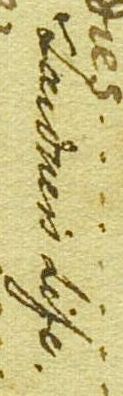- Lardner's Life.
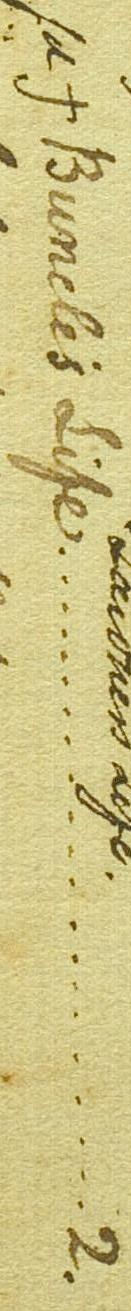Buncle's Life...................2
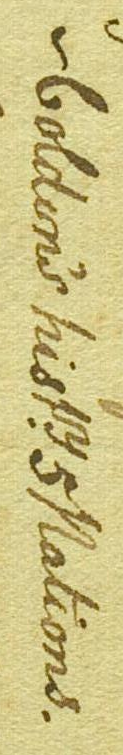- Colden's hist^y. 5 Nations.
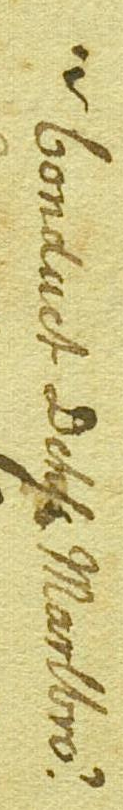- Conduct Dchss Marlbro'.
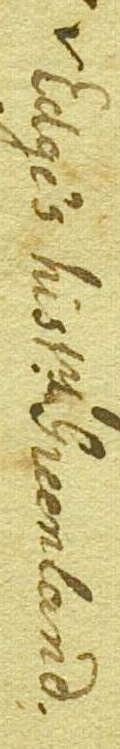- Edge's hist^y. Greenland.
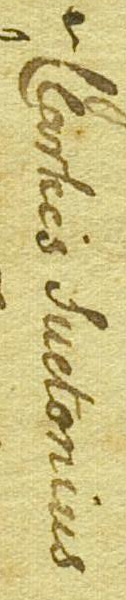- Clarke's Suetonius
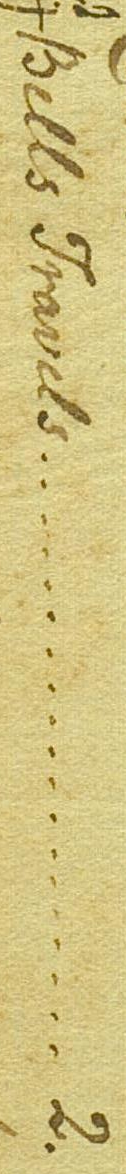Bells Travels................... 2.
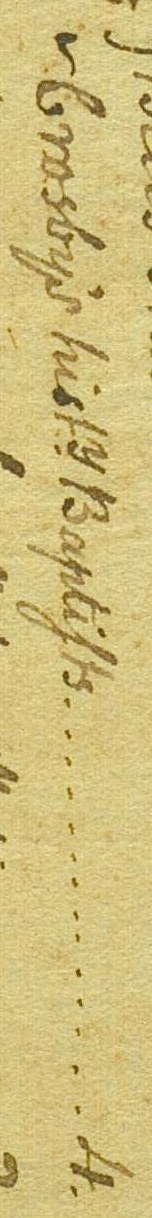- Crosby's hist^y. Baptists..............4.
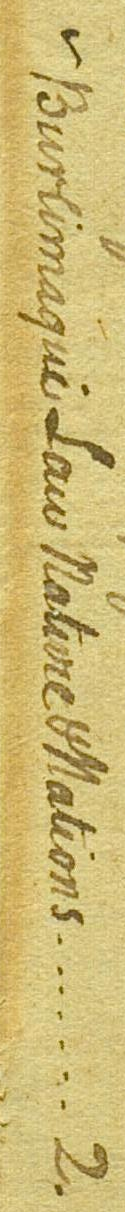- Burlimaque Law Nature & Nations....... 2.
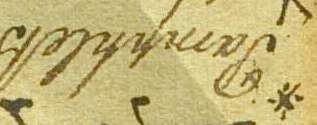* Pamphlets
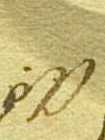d^o.
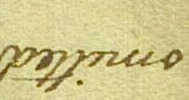omitted.
